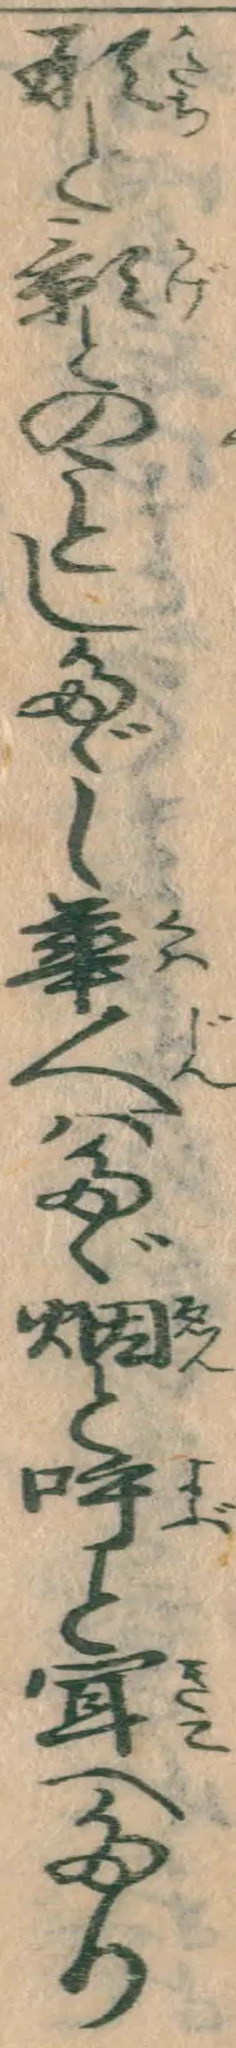形と影とのことしたヾし華人はたヾ烟と呼と聞へたり
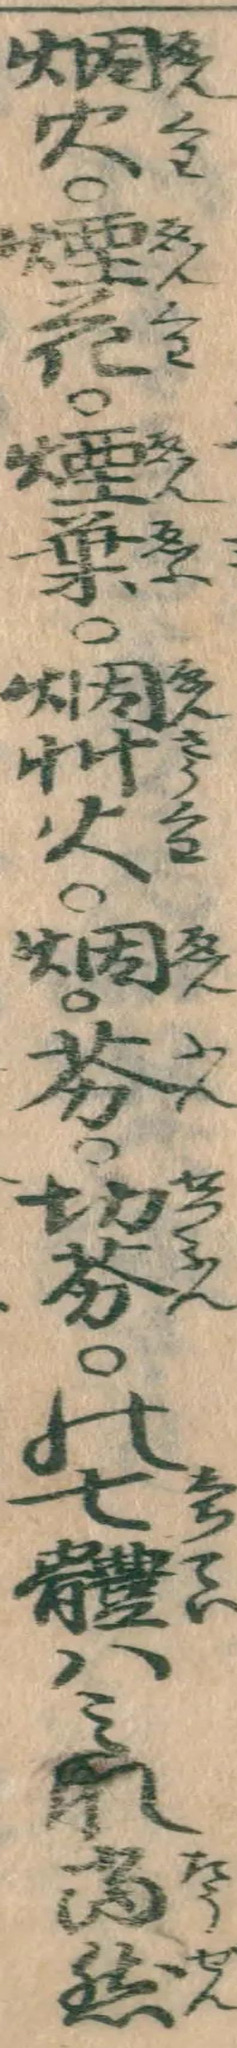烟火◦煙花◦煙葉◦烟草火◦烟◦芬◦切芬◦の七体はみな当然
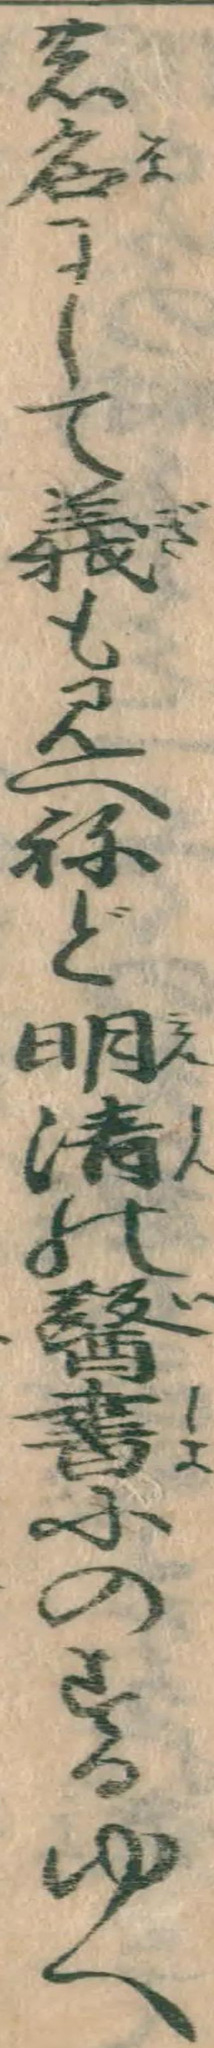の名にして義も見へねど明清の医書にのするゆへ
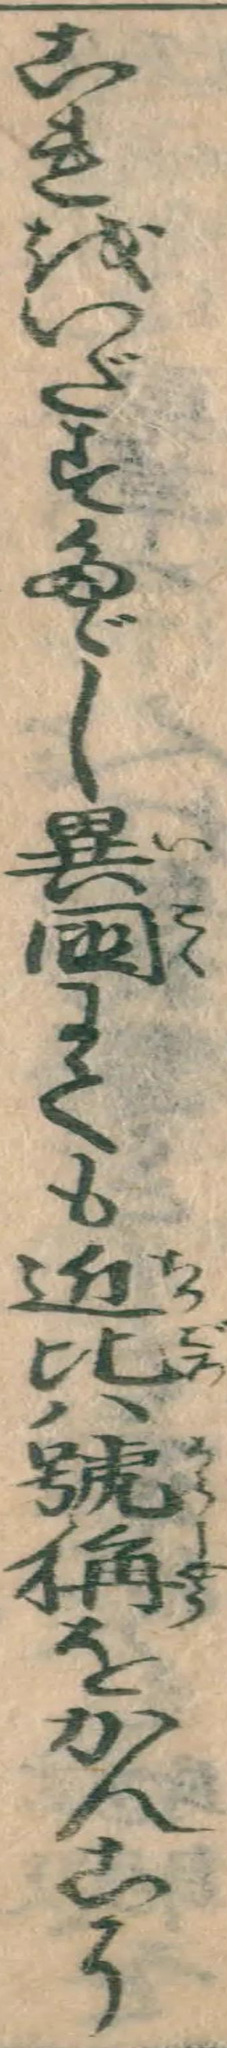これをいだすたヾし異国にても近比は号称をかんこに
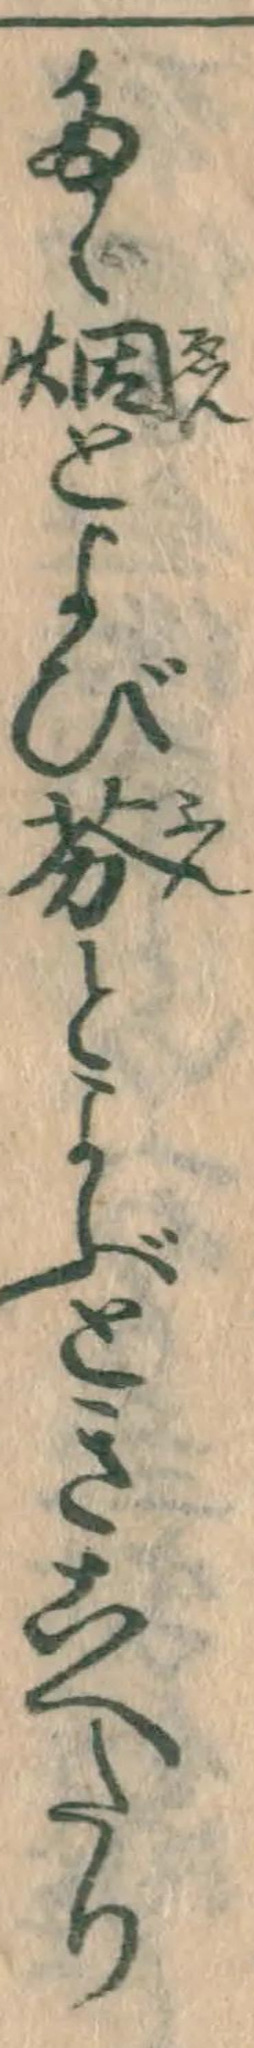たヾ烟とよび芬とよぶときこへたり
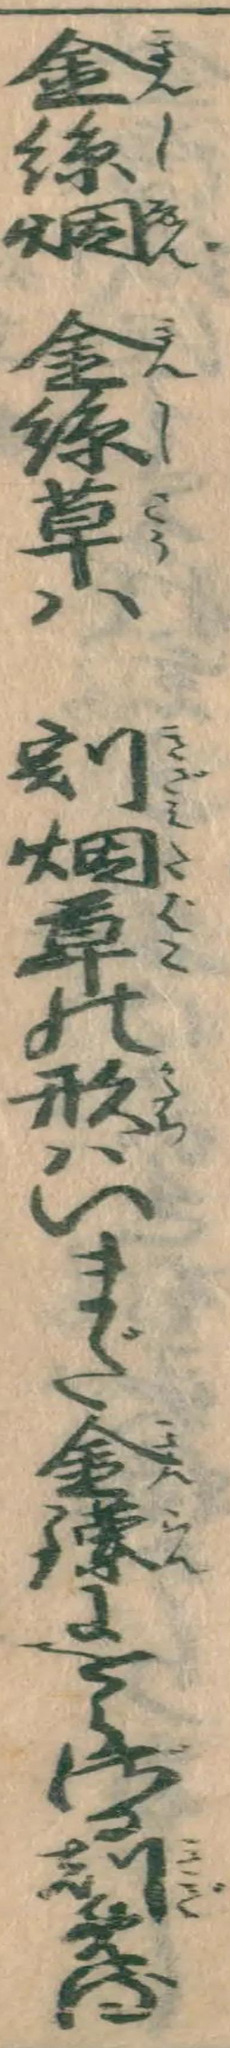金糸烟金糸草は割烟草の形はいまだ金襴にをらざる刻める

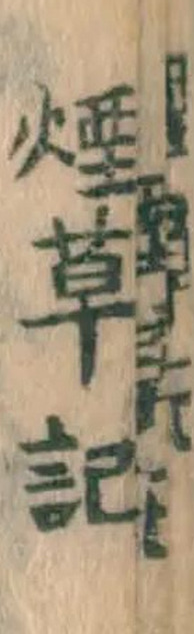煙草記
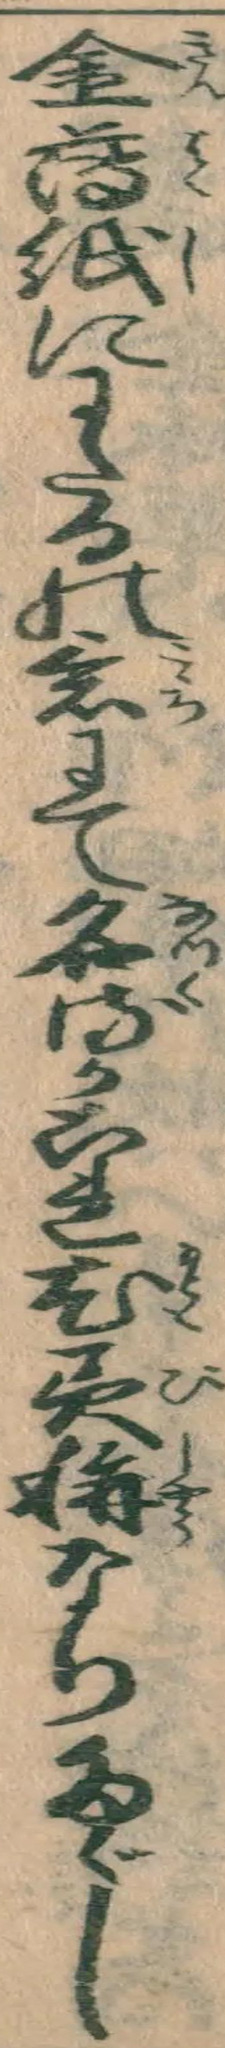金薄紙ににたるの意にて名るかこれ尤美称なりたゞし
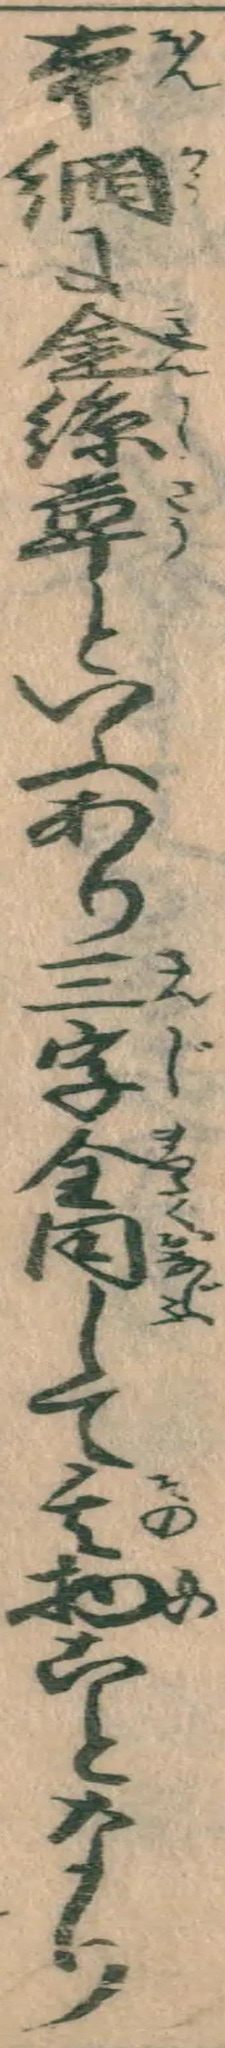本綱に金糸草といふあり三字全同して其物ことなり
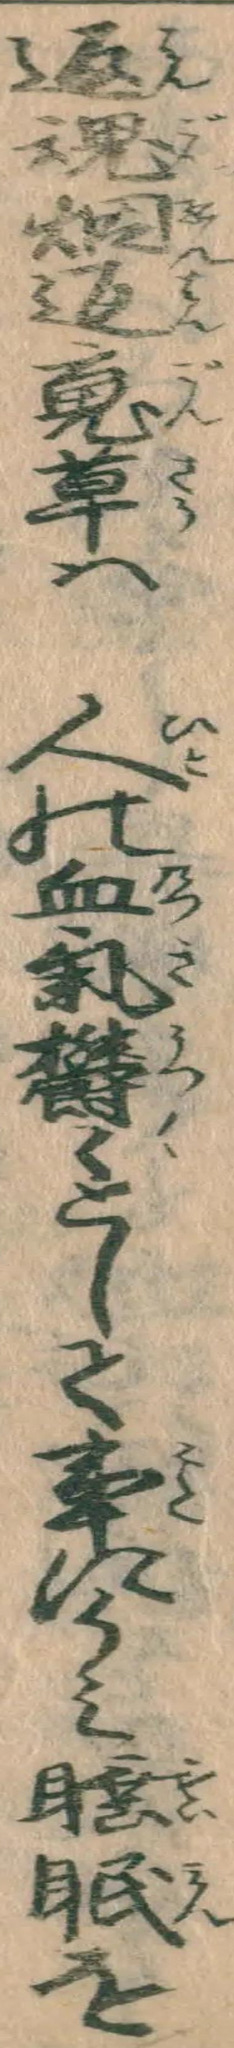返魂烟返䰟草は人の血気鬱々として事にうみ睡眠を
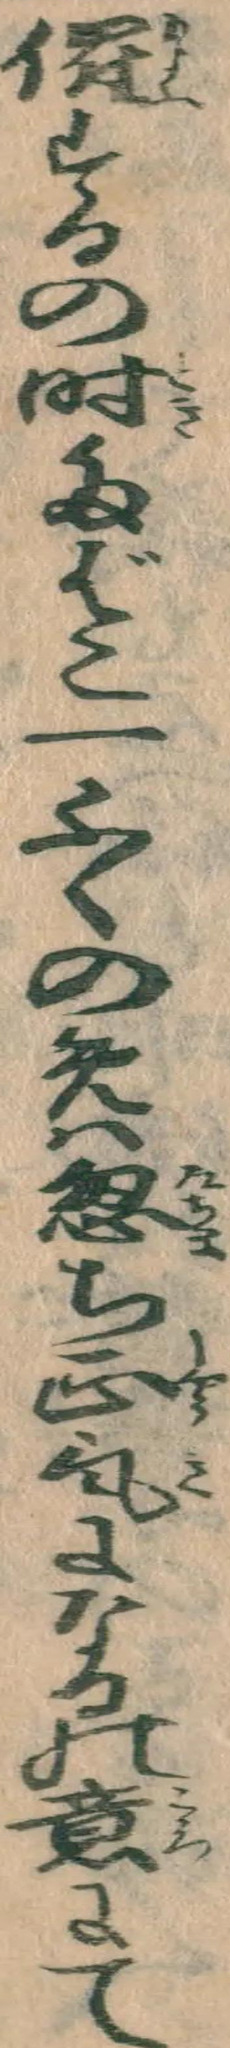催するの時たばこ一ふくのめは忽ち正気になるの意にて
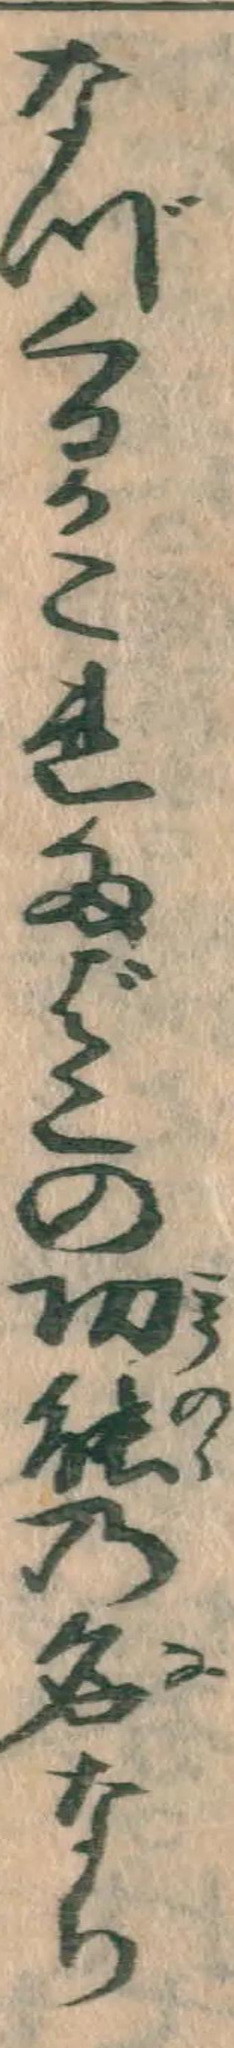なづくるかこれたばこの功能の名なり
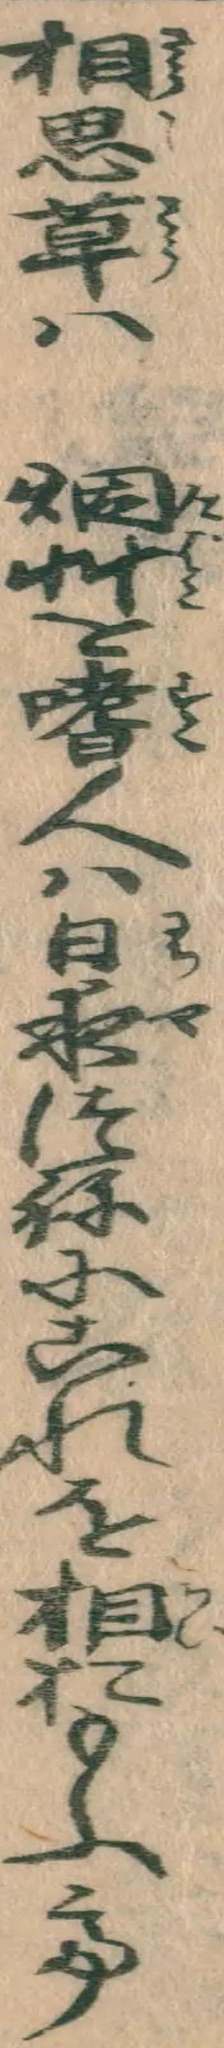相思草は烟草を嗜人は日夜つねにこれを相おもふて
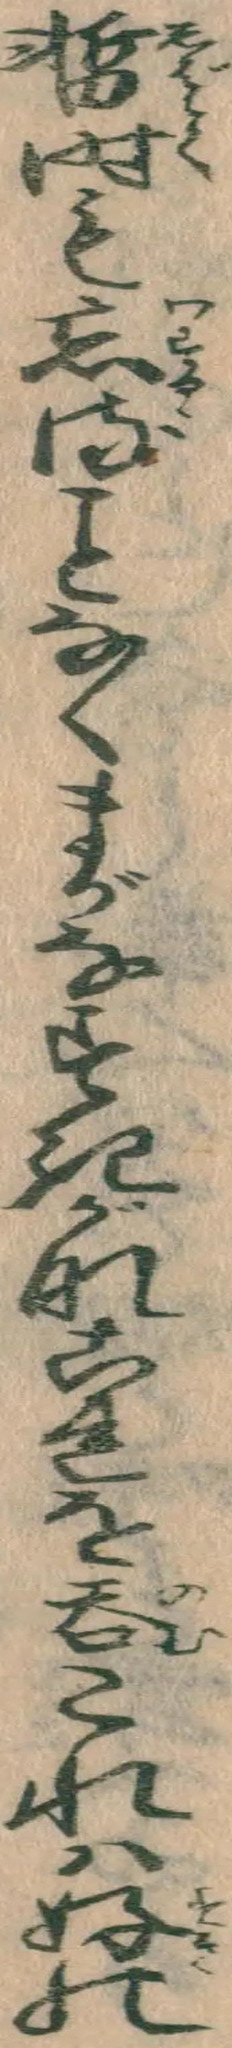暫時も忘ることなくまがなすきがなこれを呑これは好の
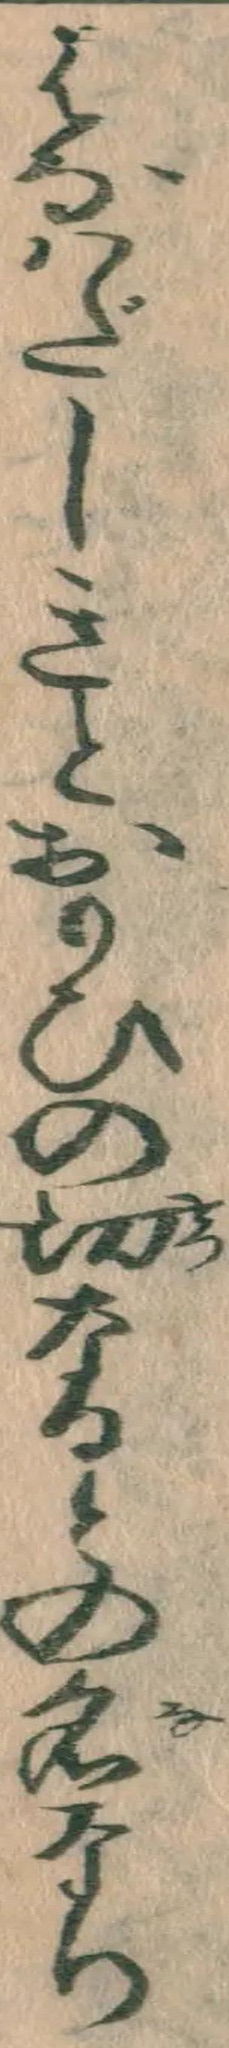はなはだしきとおもひの切なるとの名なり
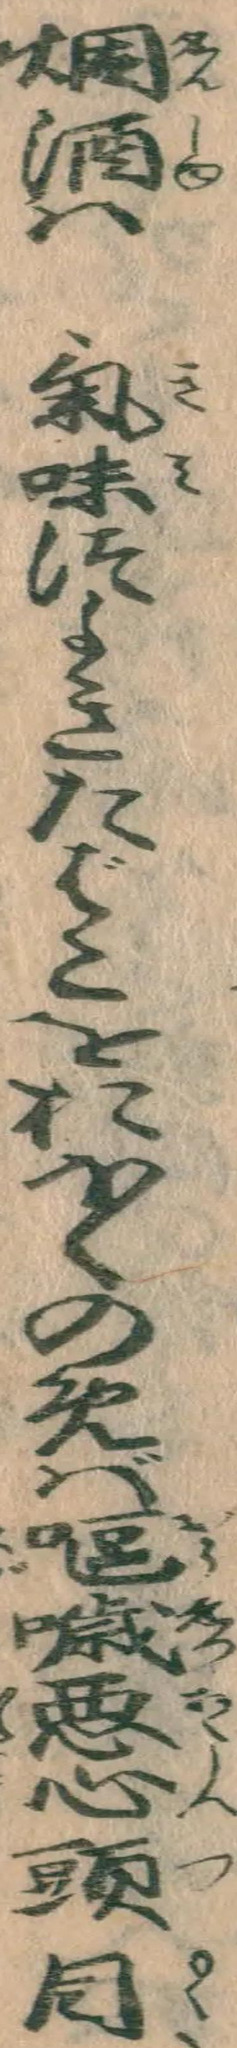烟酒は気味つよきたばこをおほくのめば嘔噦悪心頭目
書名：煙草記
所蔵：国立国会図書館 National Diet Library, JAPAN
